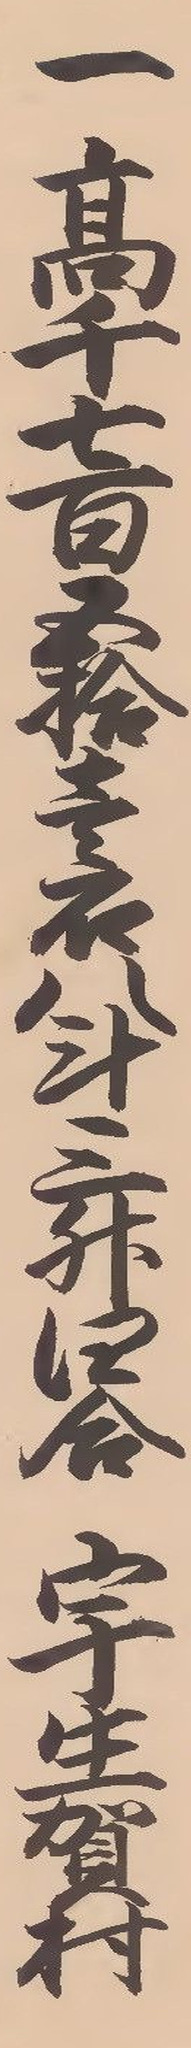一高千七百五拾壱石八斗三升四合宇生賀村
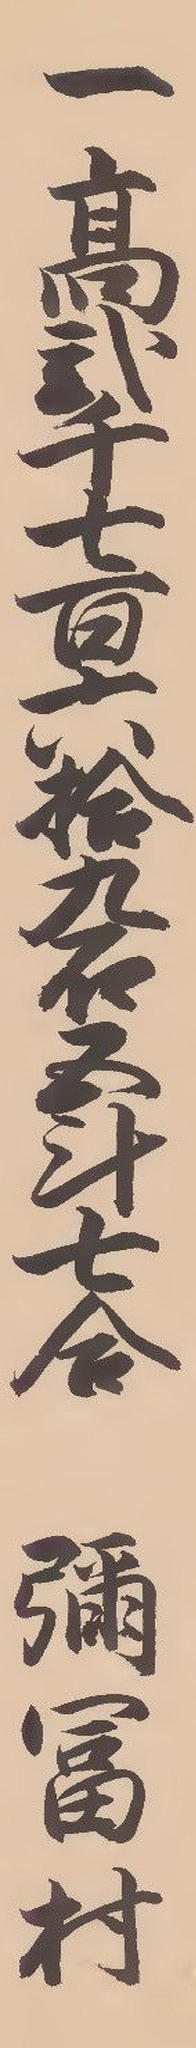一高弐千七百六拾九石五斗七合彌冨村

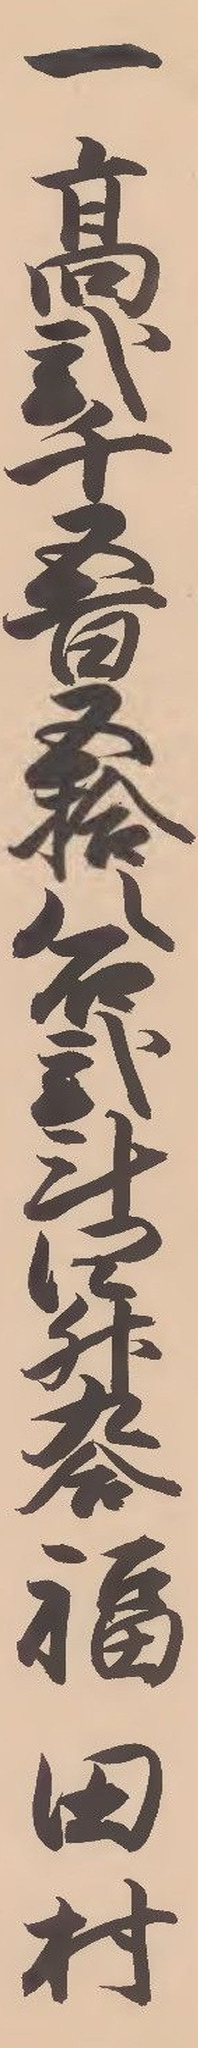一高弐千五百五拾八石弐斗四升九合福田村
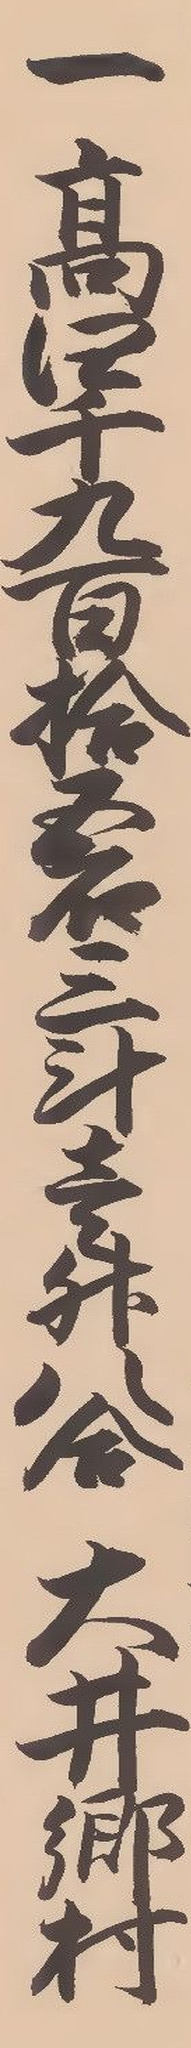一高四千九百拾五石三斗壱升八合大井郷村
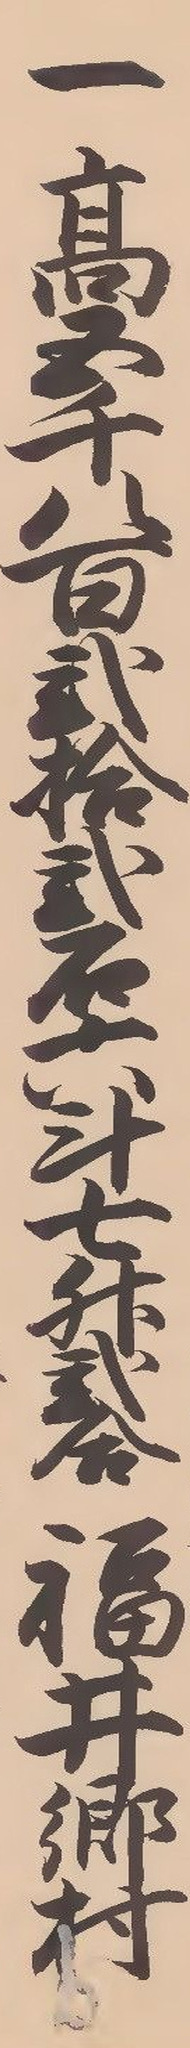一高五千八百弐拾弐石六斗七升弐合福井郷村
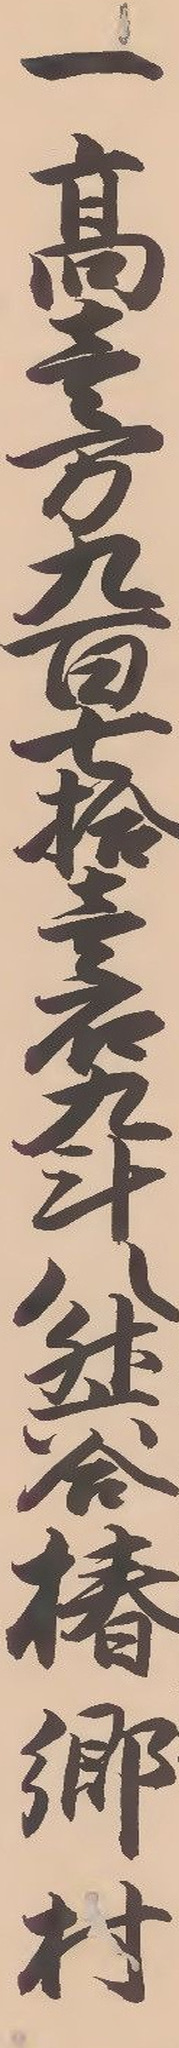一高壱万九百七拾壱石九斗八升六合椿郷村
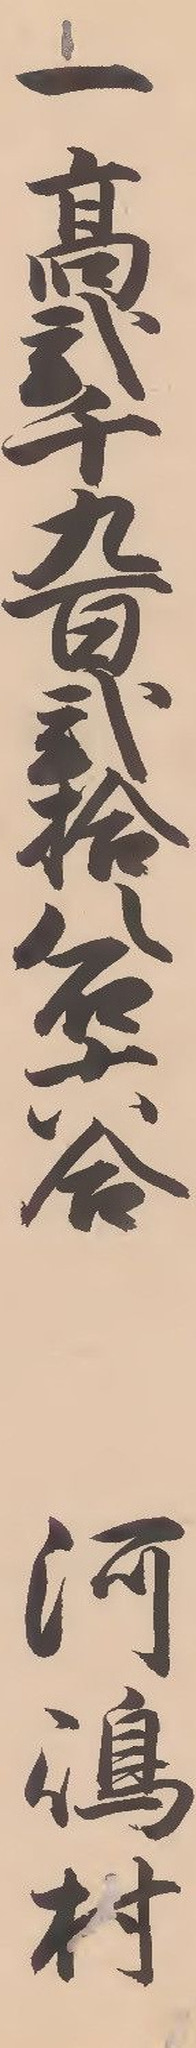一高弐千九百弐拾八石六合河嶋村
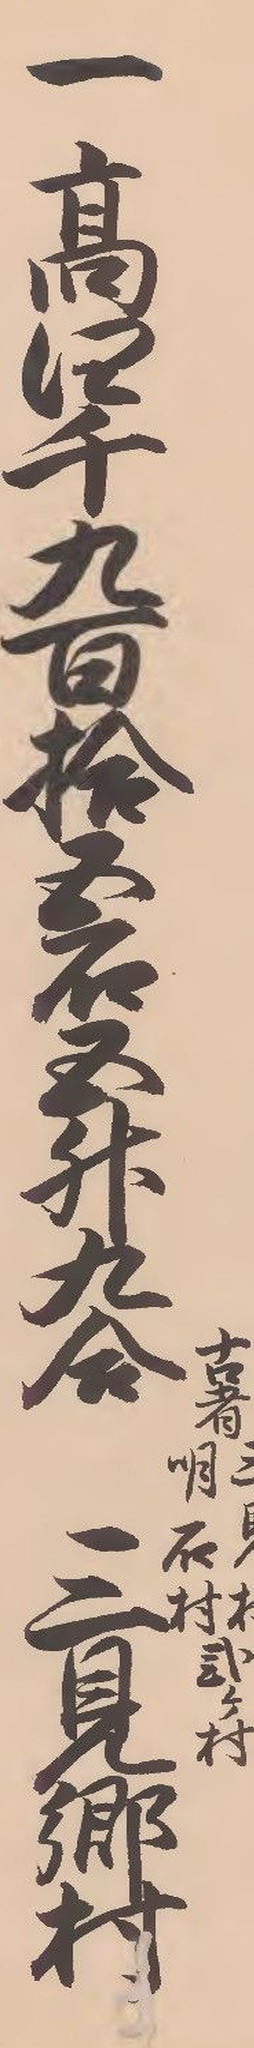一高四千九百拾五石五升九合三見郷村
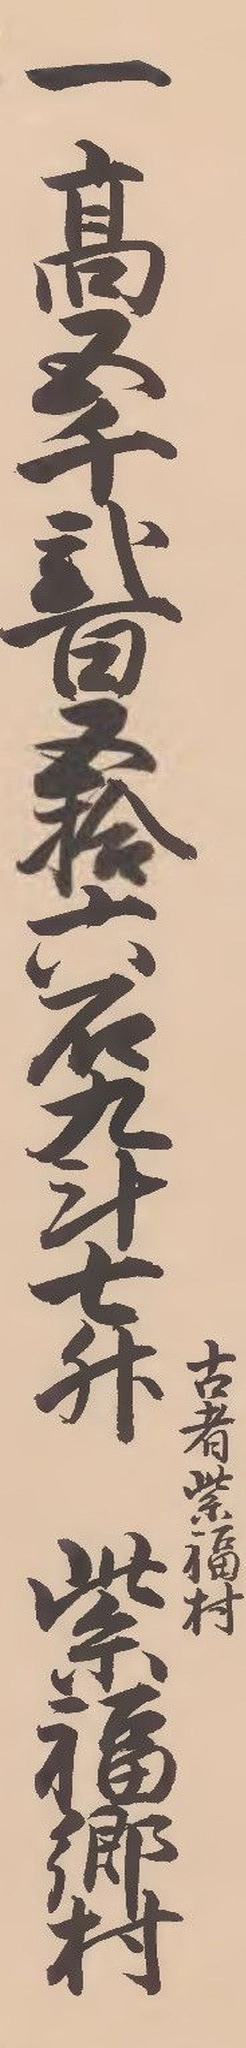一高五千弐百五拾六石九斗七升紫福郷村
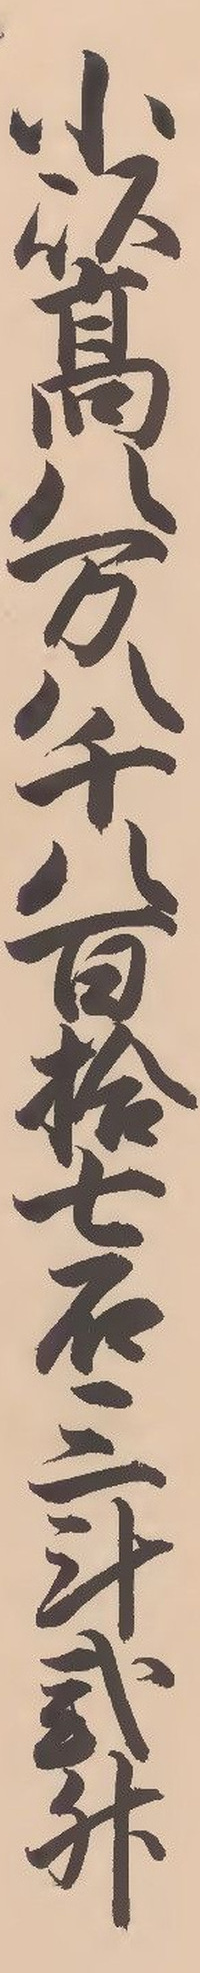小以高八万八千八百拾七石三斗弐升

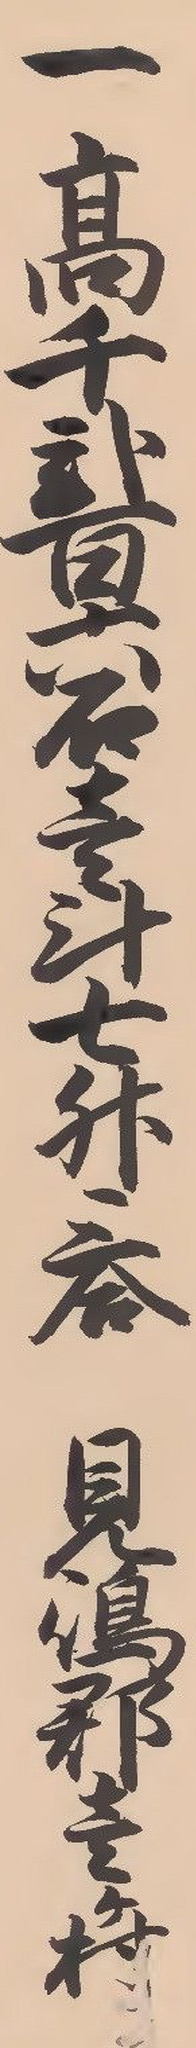一高千弐百六石壱斗七升三合見嶋郡壱ヶ村
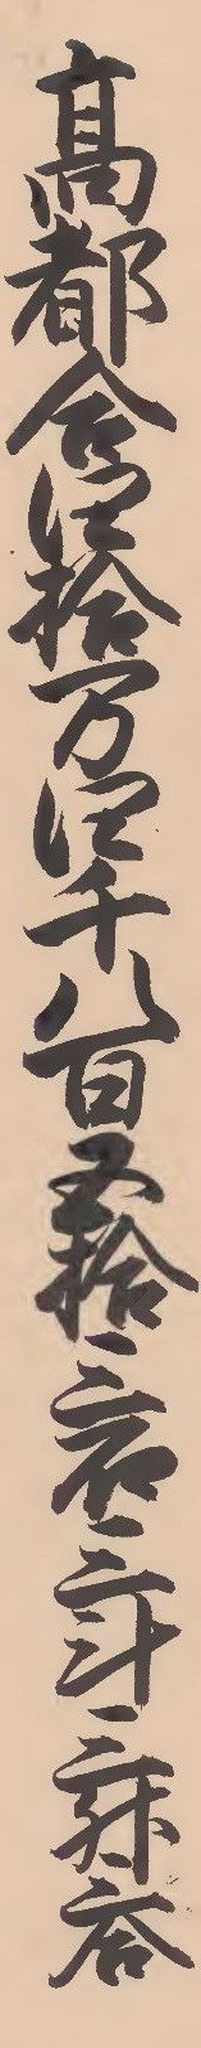高都合四拾万四千八百五拾三石三斗三升三合
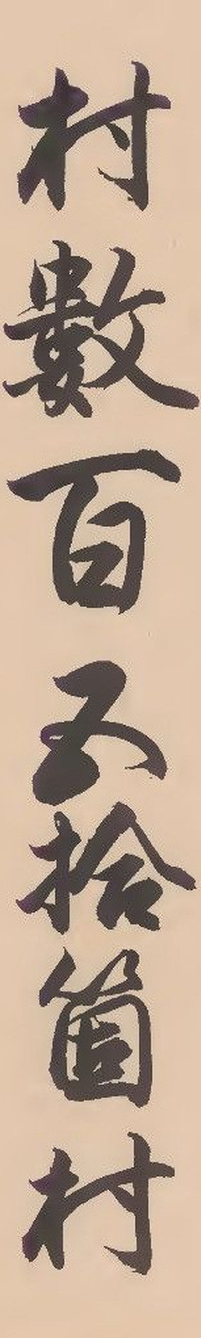村數百五拾箇村

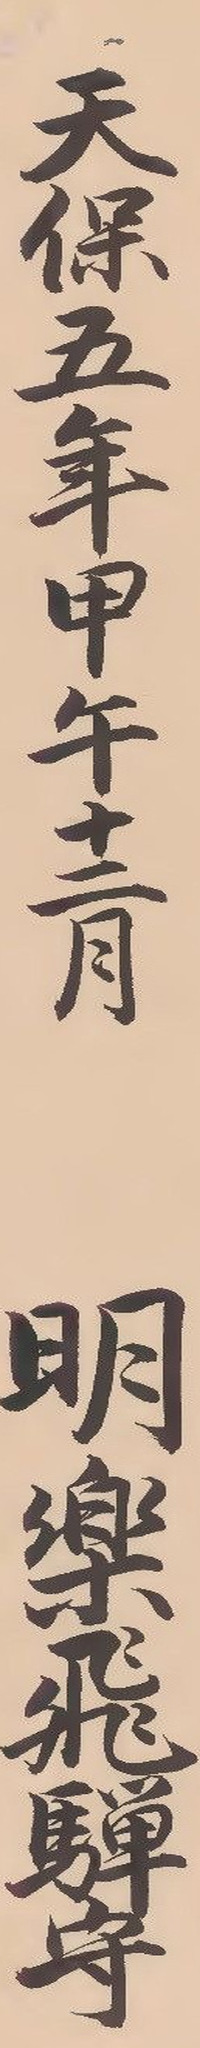天保五年甲午十二月明樂飛騨守
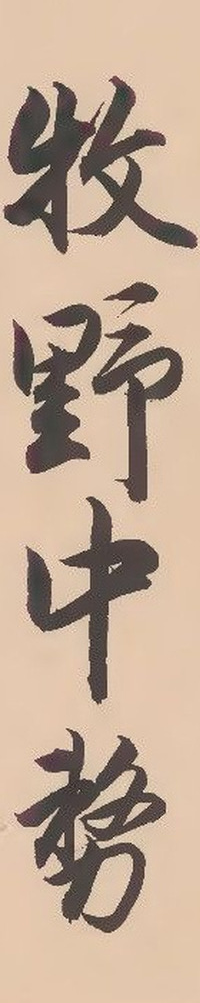牧野中務
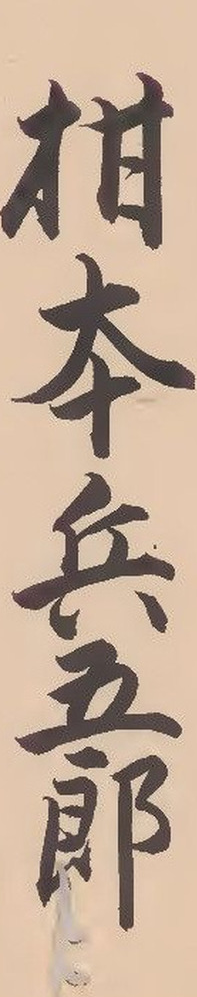柑本兵五郎
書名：長門国郷帳
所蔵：国立公文書館 National Archives of Japan
